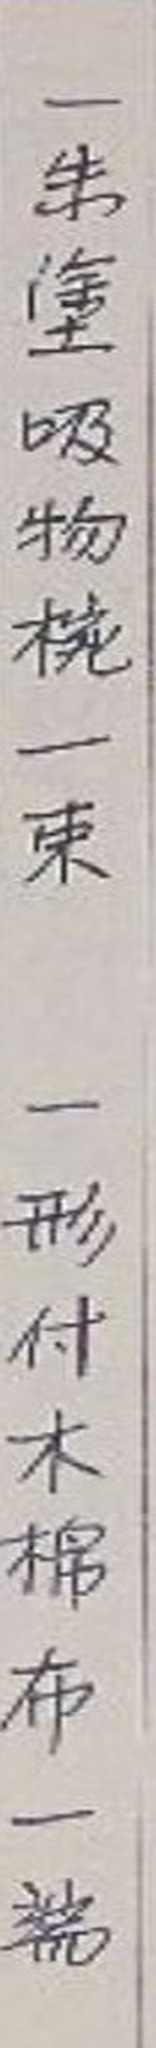一朱塗吸物椀一束一形付木棉布一端
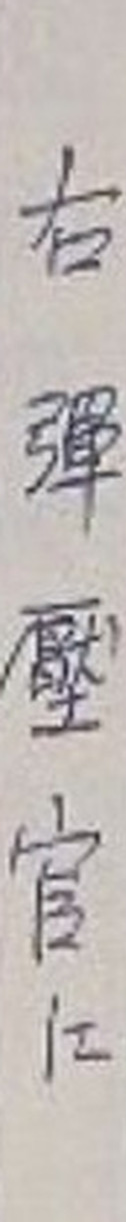右弾圧官え
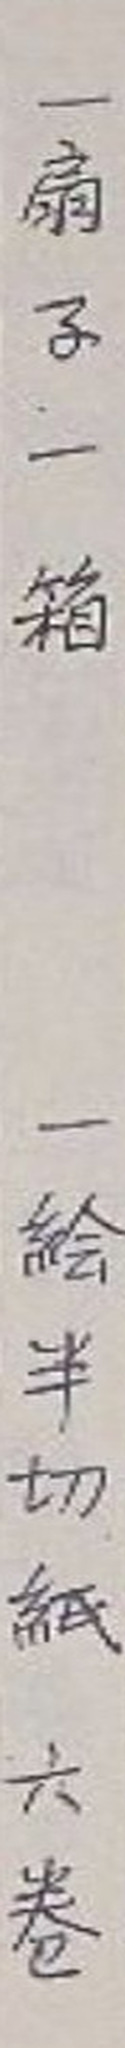一扇子一箱一絵半切紙六巻
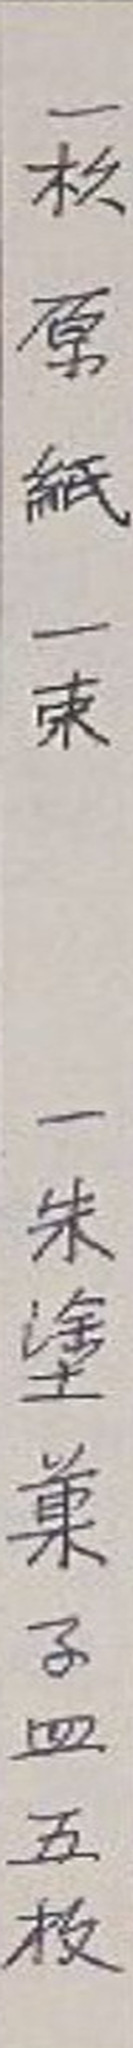一杉原紙一束一朱塗菓子皿五枚
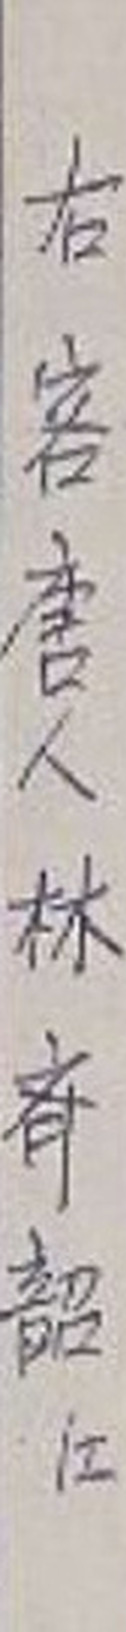右客唐人林斉韶え
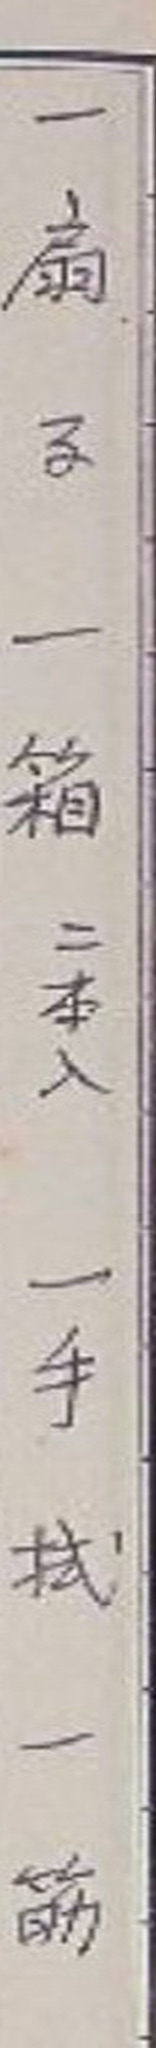一扇子一箱二本入一手拭一筋
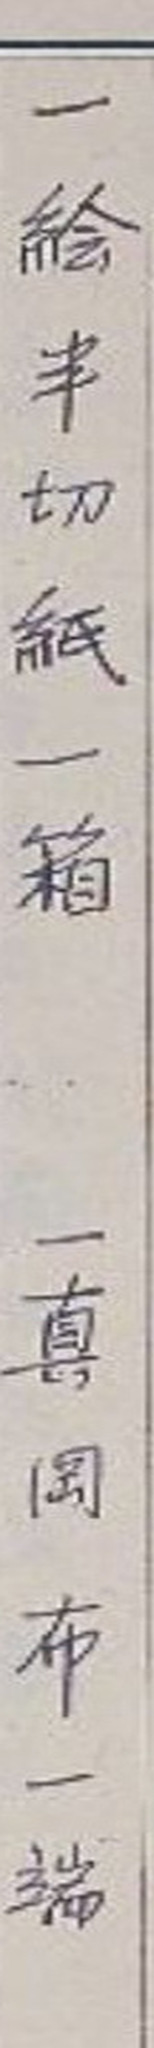一絵半切紙一箱一真岡布一端
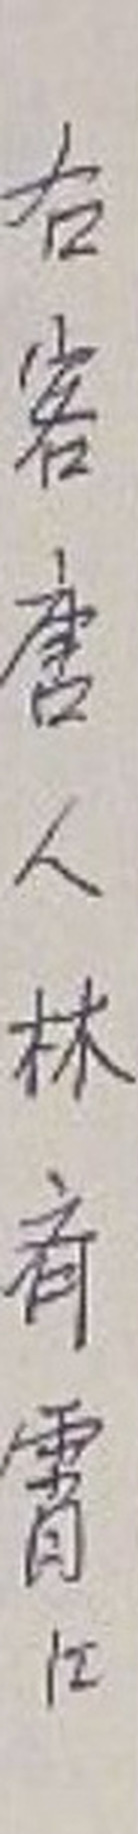右客唐人林斉霄え
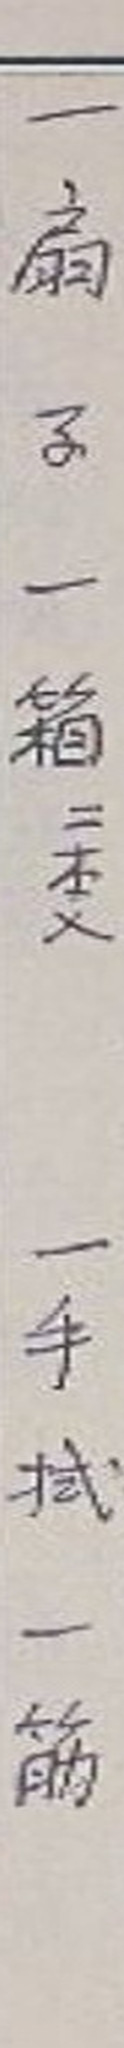一扇子一箱二本入一手拭一筋
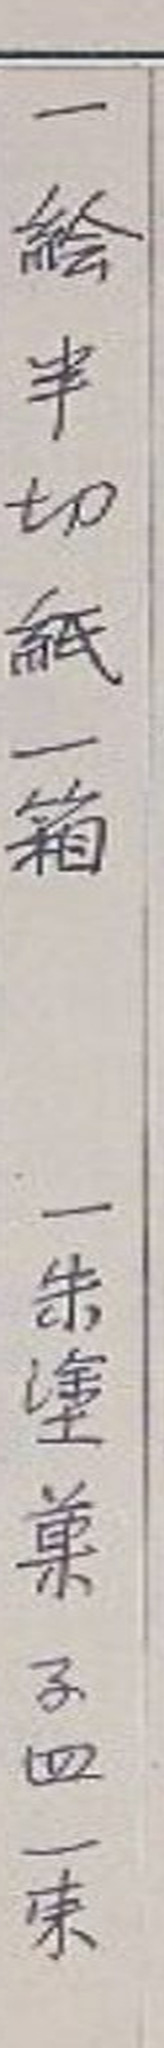一絵半切紙一箱一朱塗菓子皿一束
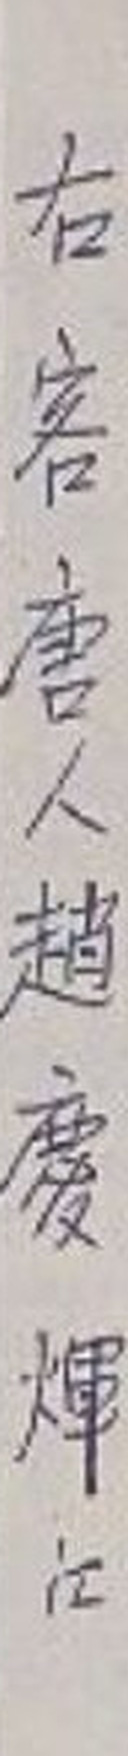右客唐人趙慶煇え
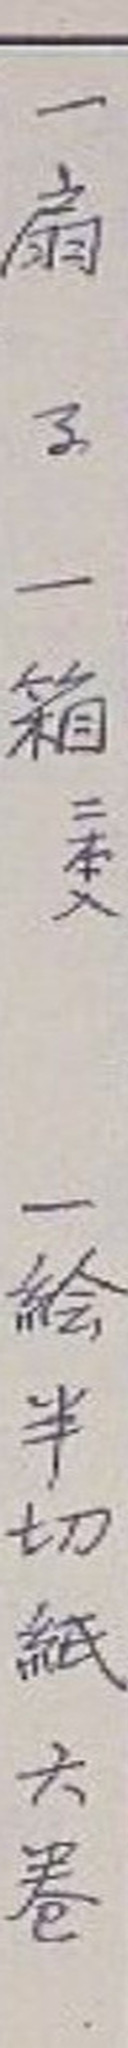一扇子一箱二本入一絵半切紙六巻
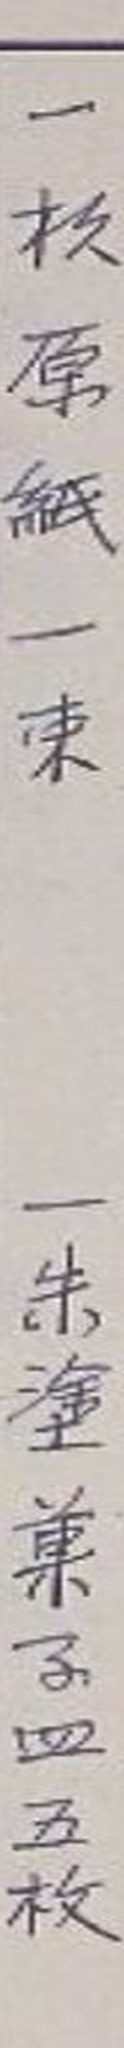一杉原紙一束一朱塗菓子皿五枚
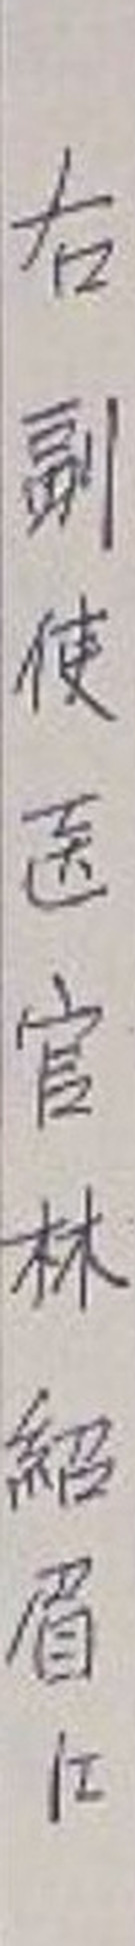右副使医官林紹眉え
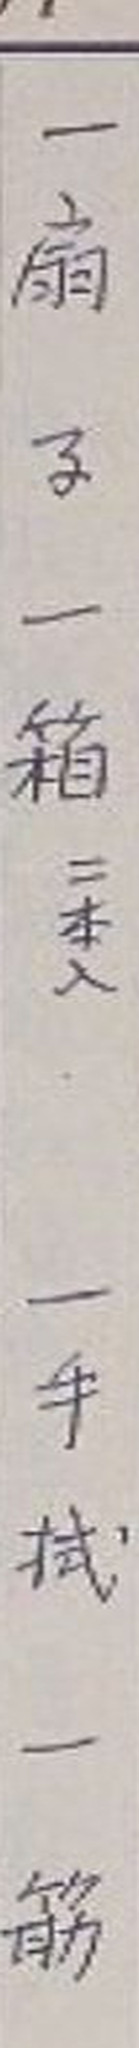一扇子一箱二本入一手拭一筋
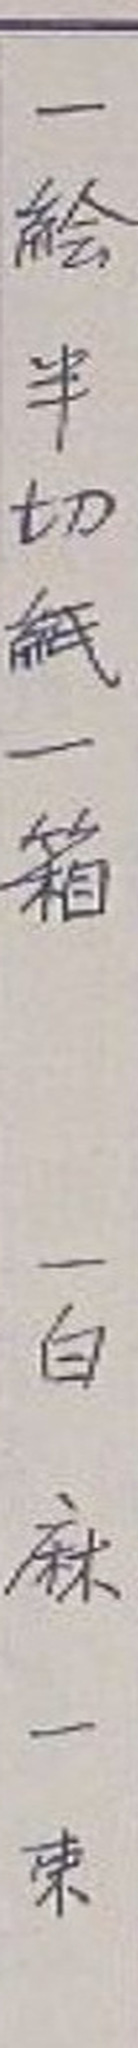一絵半切紙一箱一白麻一束
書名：支那冊封使来琉諸記 下巻
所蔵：University of the Ryukyus Library
